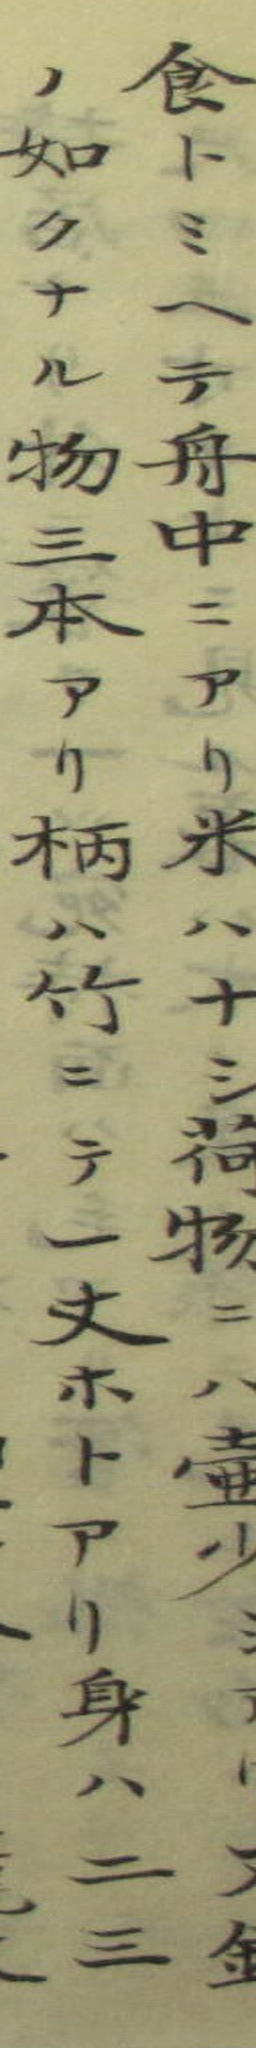ノ如クナル物三本アリ柄ハ竹ニテ一丈ホトアリ身ハ二三
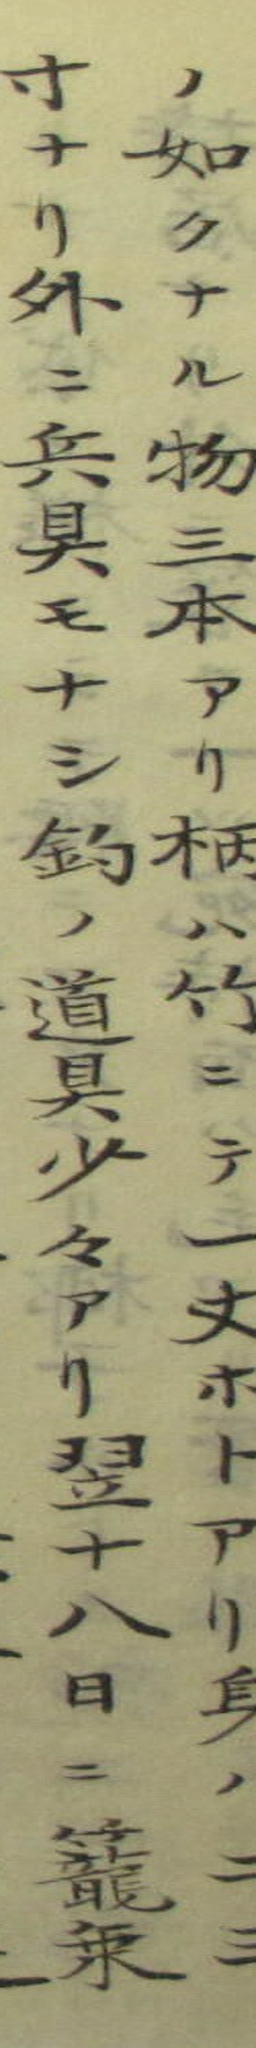寸ナリ外ニ兵具モナシ釣ノ道具少々アリ翌十八日ニ籠乗
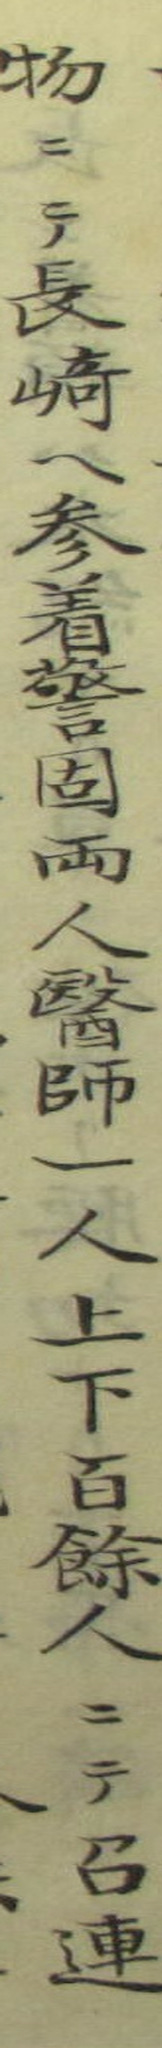物ニテ長崎ヘ参着警固両人醫師一人上下百餘人ニテ召連
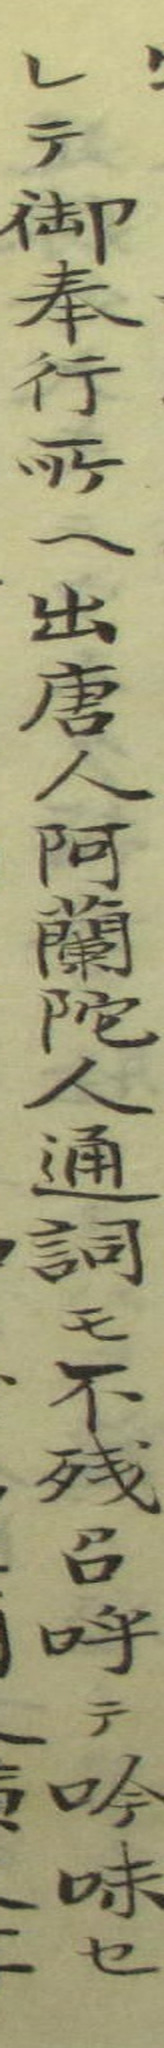レテ御奉行所ヘ出唐人阿蘭陀人通詞モ不残召呼テ吟味セ
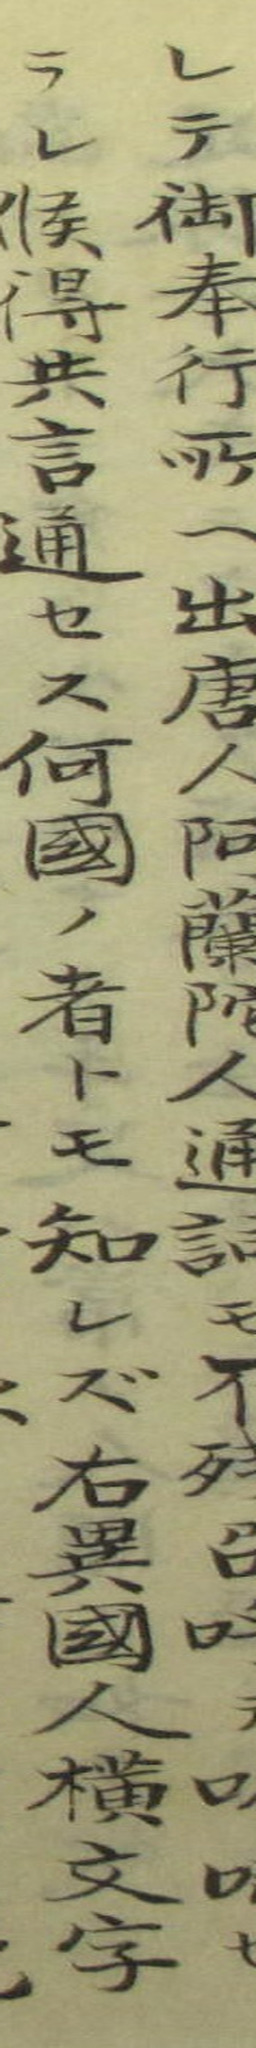ラレ候得共言通セス何國ノ者トモ知レズ右異國人横文字
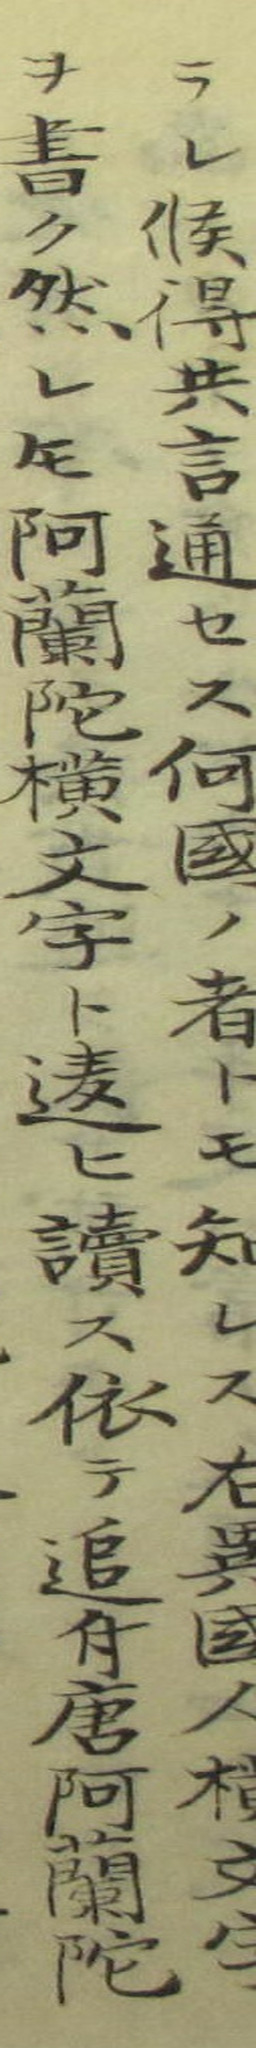ヲ書ク然レ供阿蘭陀横文字ト違ヒ讀ス依テ追付唐阿蘭陀
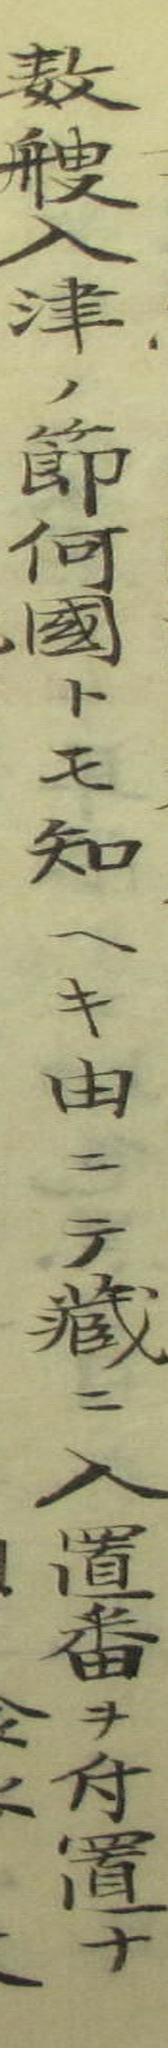数艘入津ノ節何國トモ知ヘキ由ニテ蔵ニ入置番ヲ付置ナ
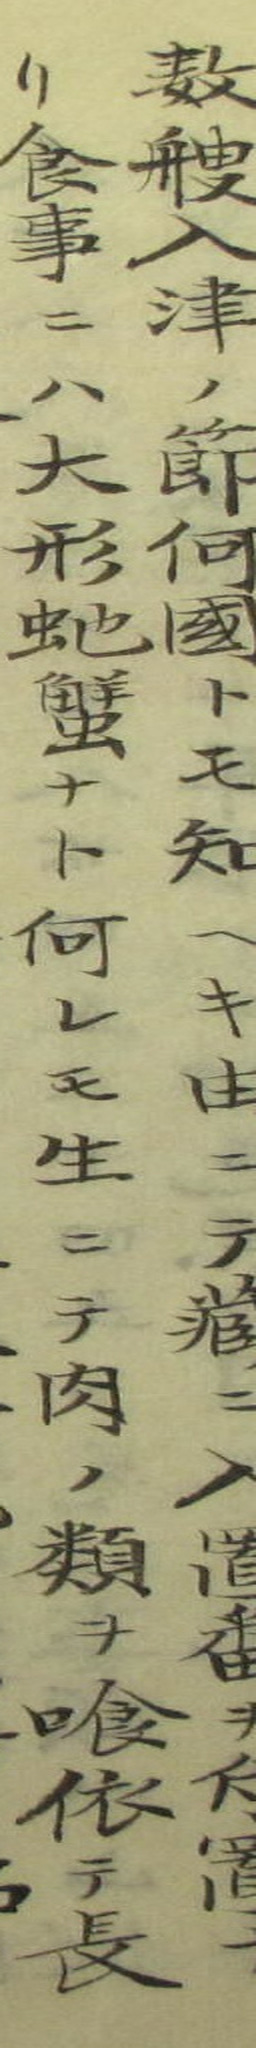リ食事ニハ大形蛇蟹ナト何レモ生ニテ肉ノ類ヲ喰依テ長
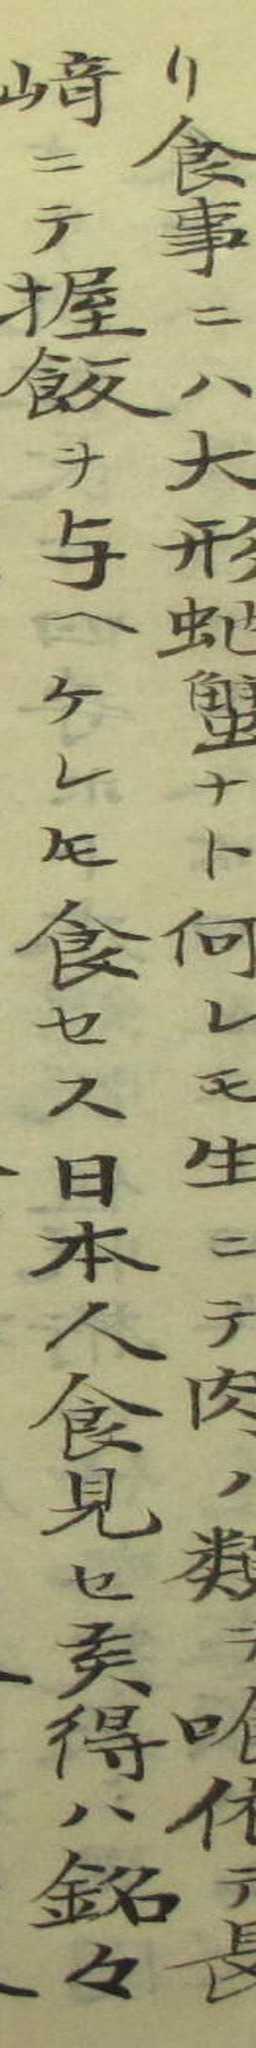﨑ニテ握飯ヲ与ヘケレ供食セス日本人食見セ候得ハ銘々
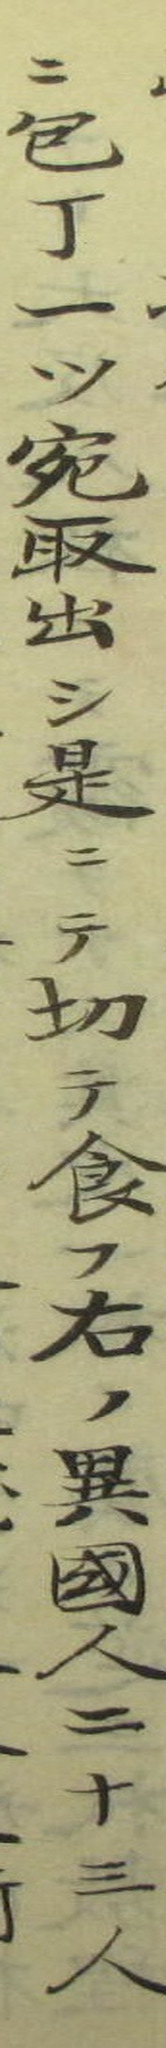ニ包丁一ツ宛取出シ是ニテ切テ食フ右ノ異國人二十三人
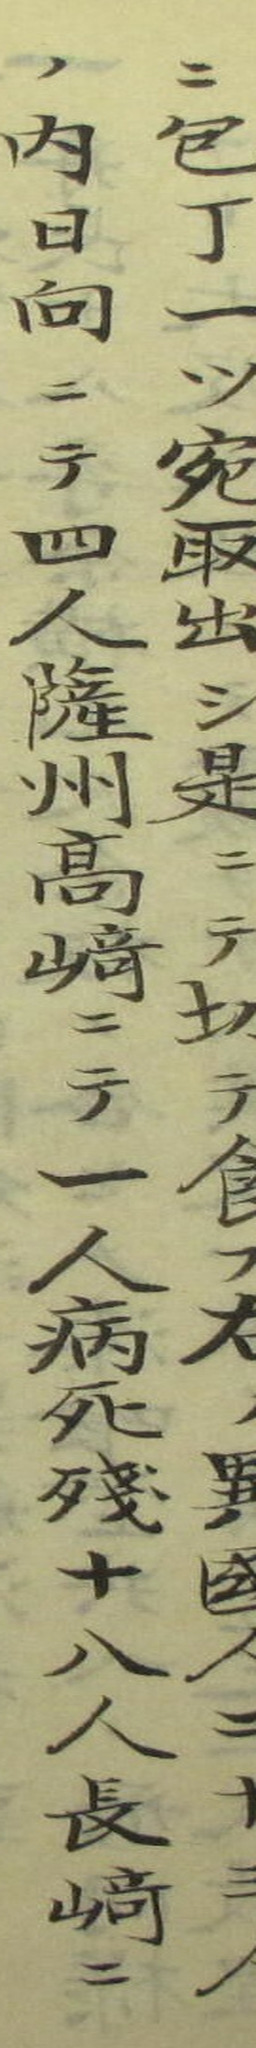ノ内日向ニテ四人薩州高崎ニテ一人病死残十八人長﨑ニ
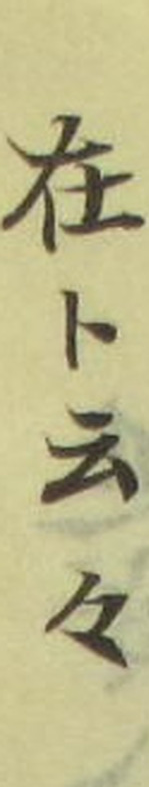在ト云々
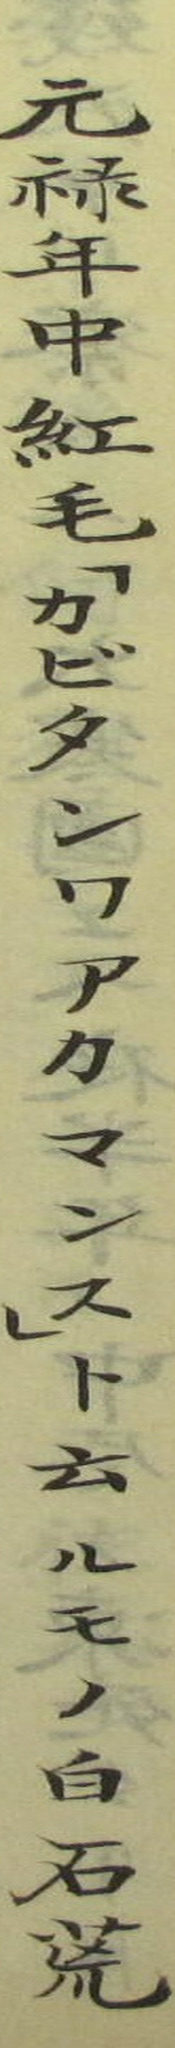元禄年中紅毛「カビタンワアカマンス」ト云ルモノ白石荒
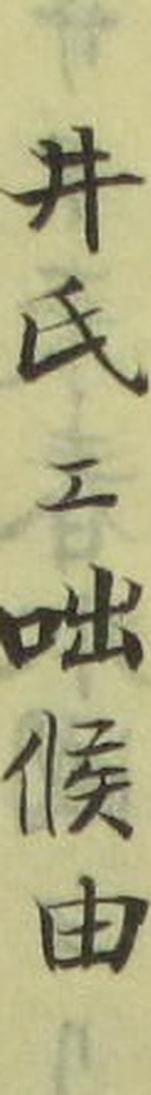井氏エ咄候由
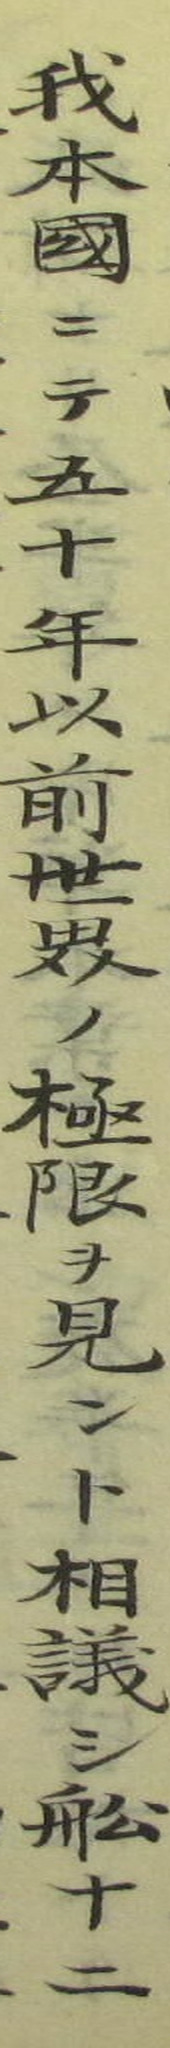我本國ニテ五十年以前世界ノ極限ヲ見ント相議シ舩十二
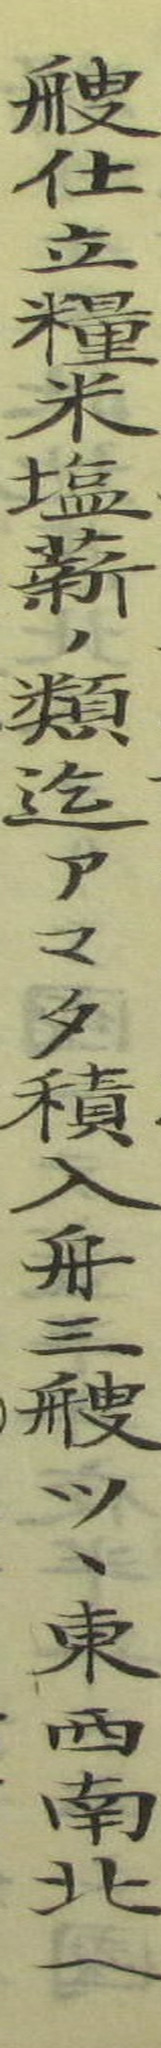艘仕立糧米塩薪ノ類迄アマタ積入舟三艘ツヽ東西南北ヘ
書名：異国船漂着記 外二
